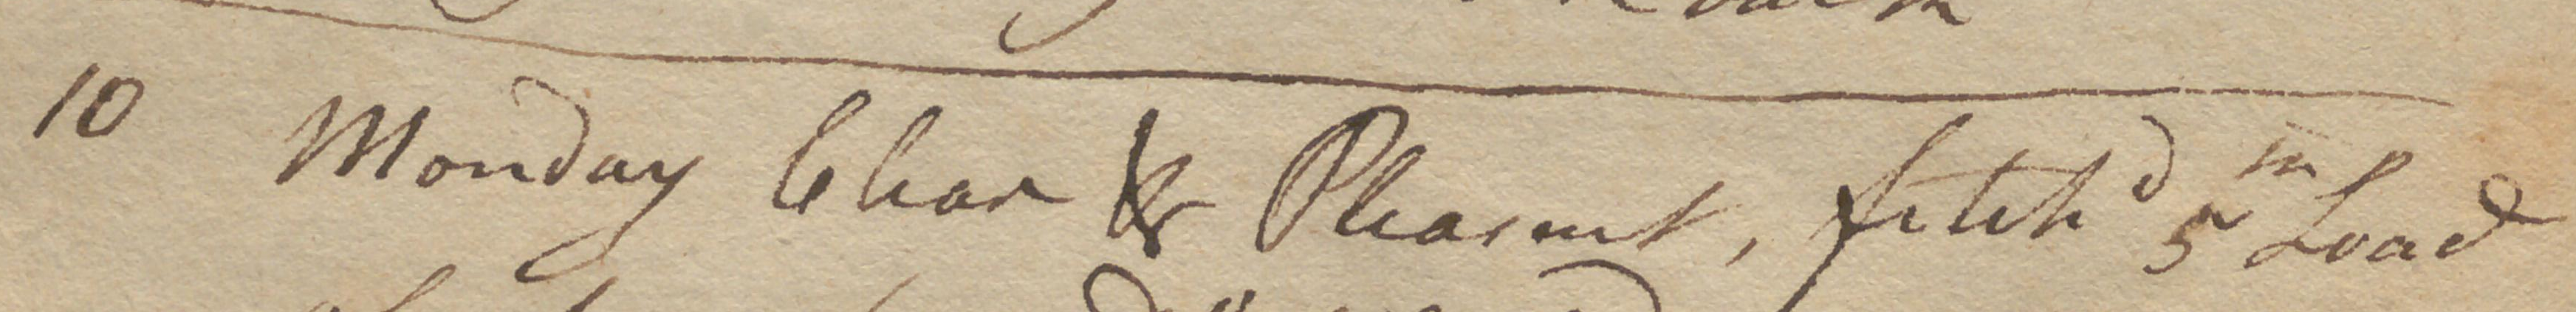10 Monday Clear & Pleasent, fetch^d 5^th Load
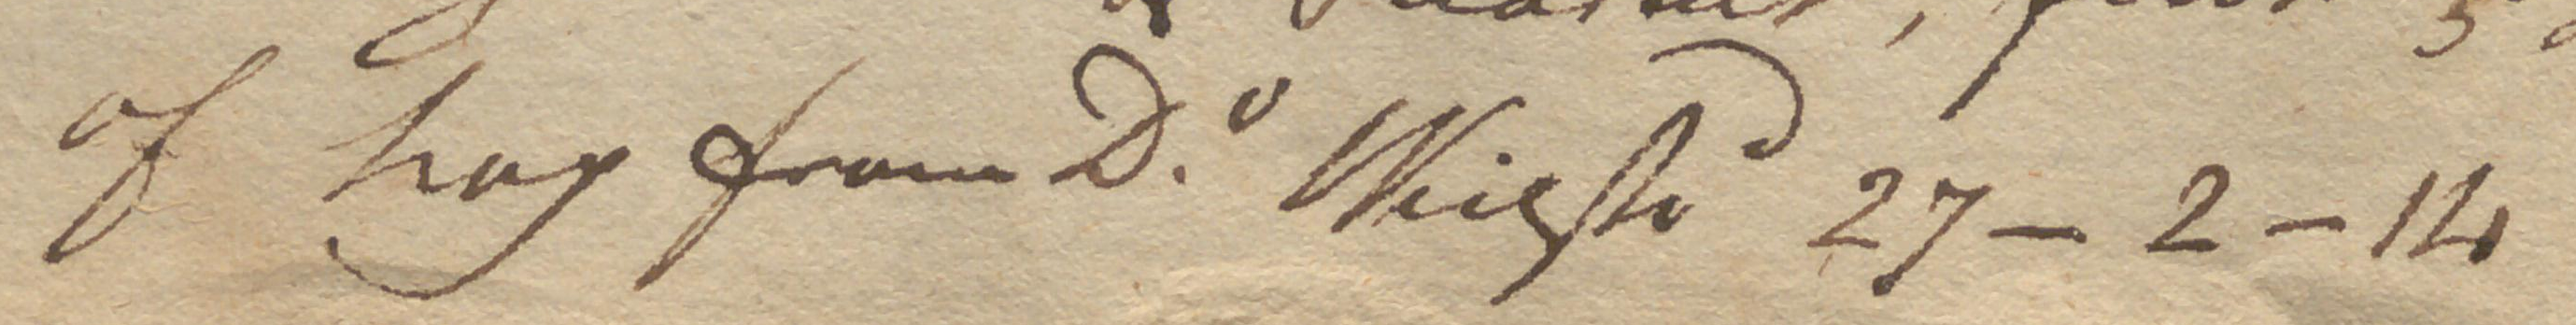of hay from D^o. Weigh^r 27- 2- 14
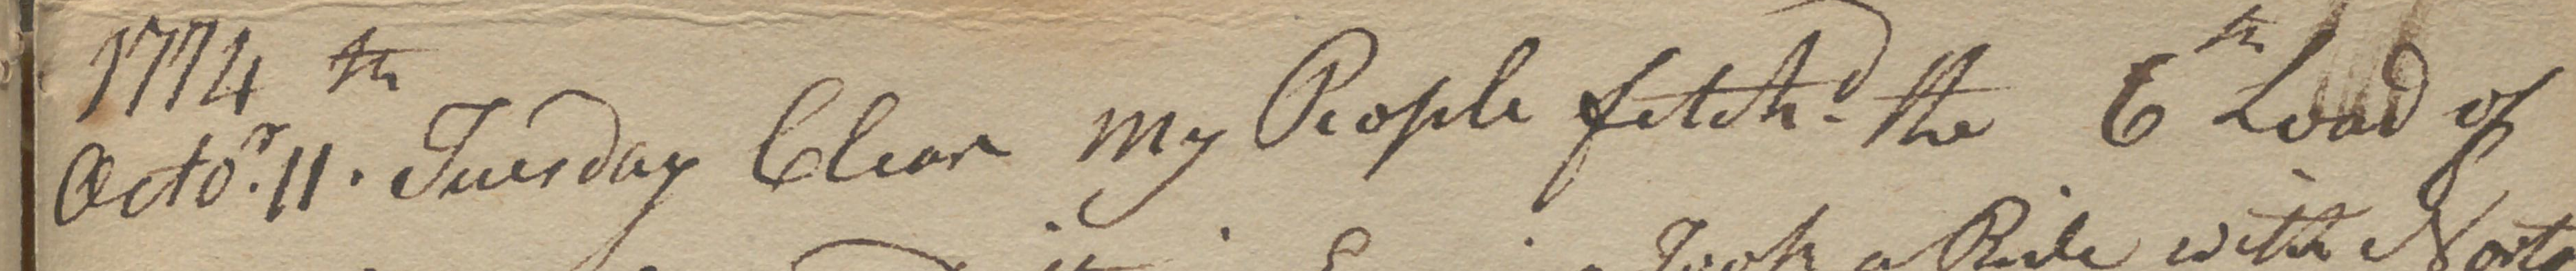Octo^r. 11th. Tuesday Clear my People fetch^d. the 6^th Load of
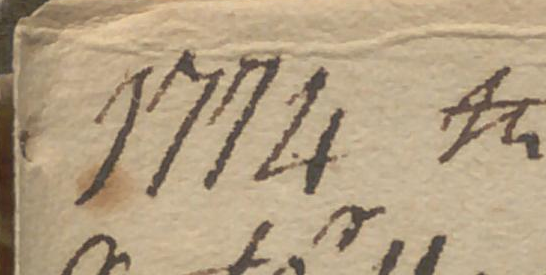1774
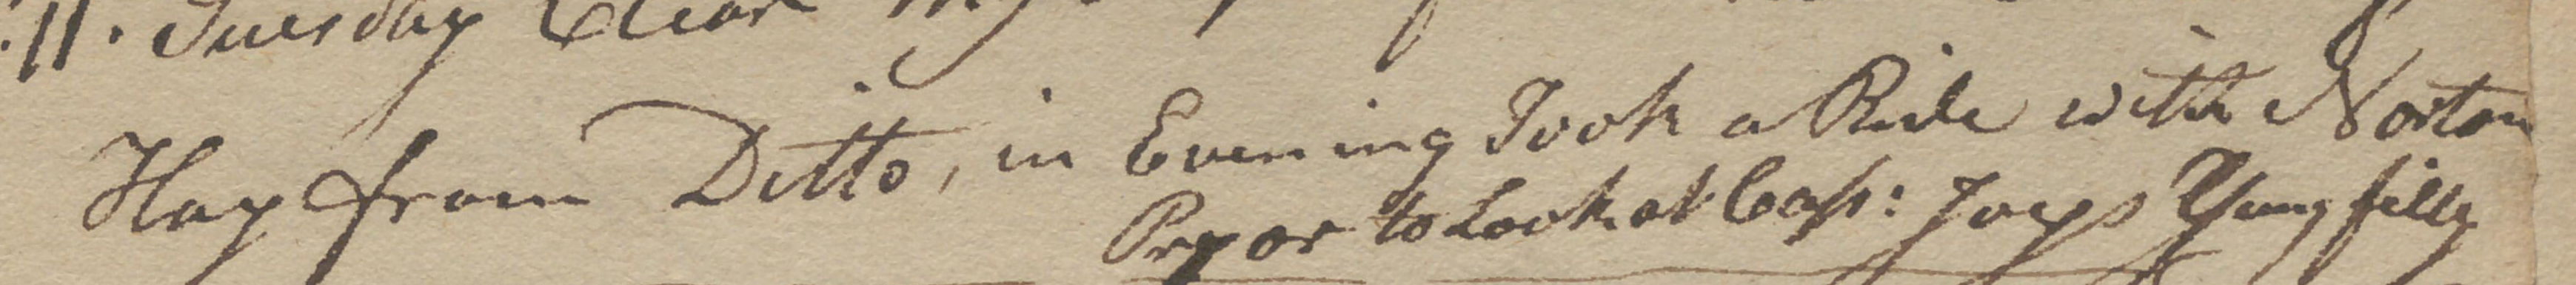Hay from Ditto, in Evening Took a Ride with Norton
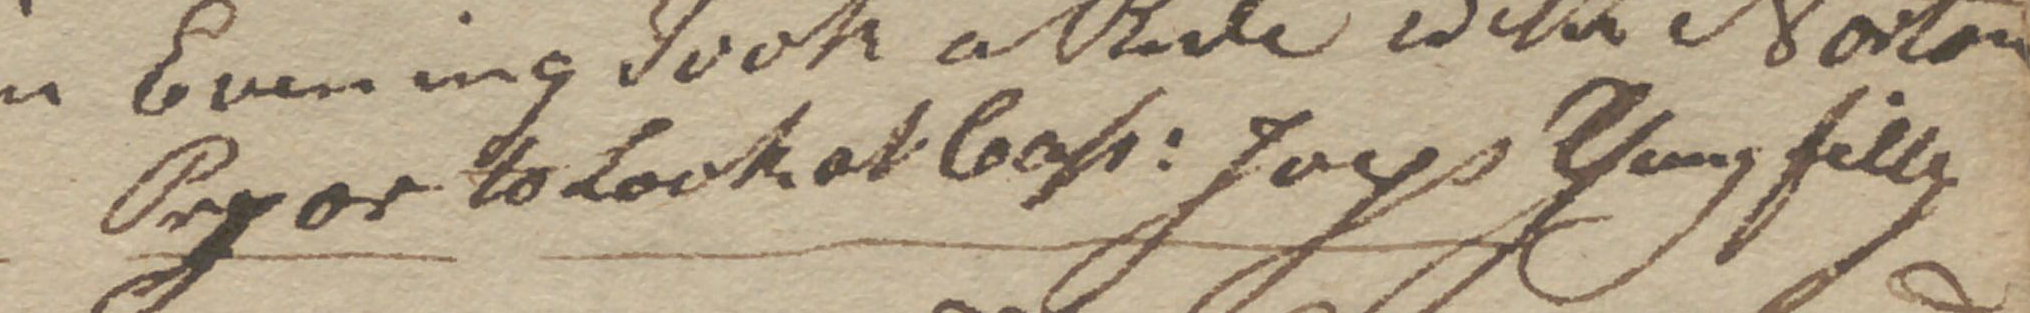Payor to Look at Cap: Joys Young filly
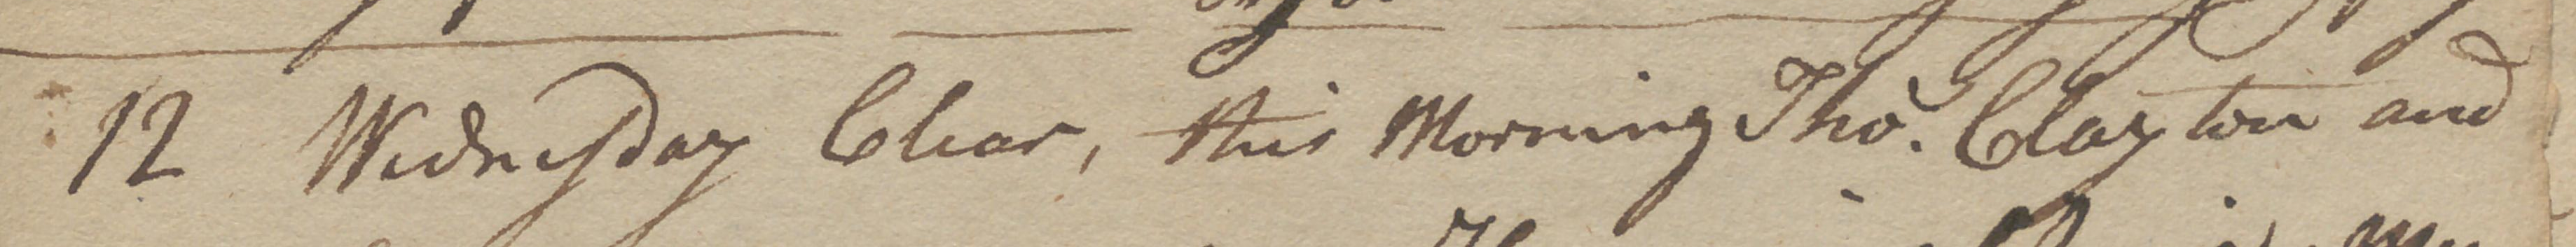12 Wednesday Clear, this Mornng Tho^s. Clayton and
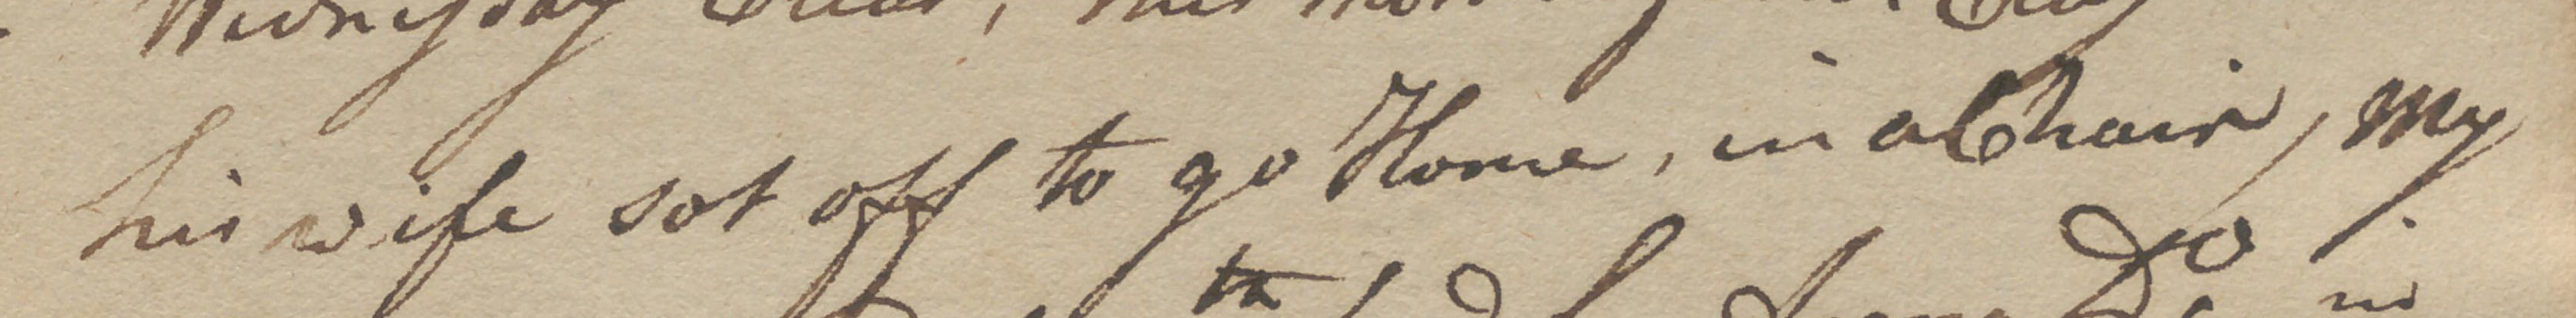his wife set off to go Home, in a Chair, My
